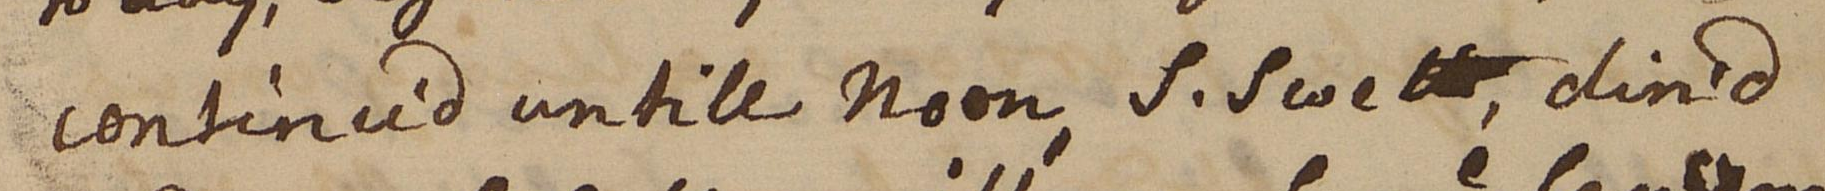continu'd untill Noon, S. Swett, din'd
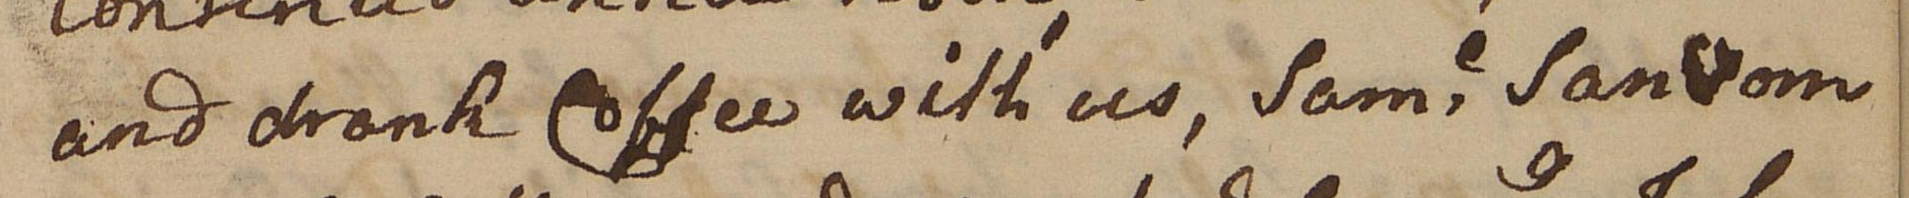and drank Coffee with us, Sam^l. Sansom
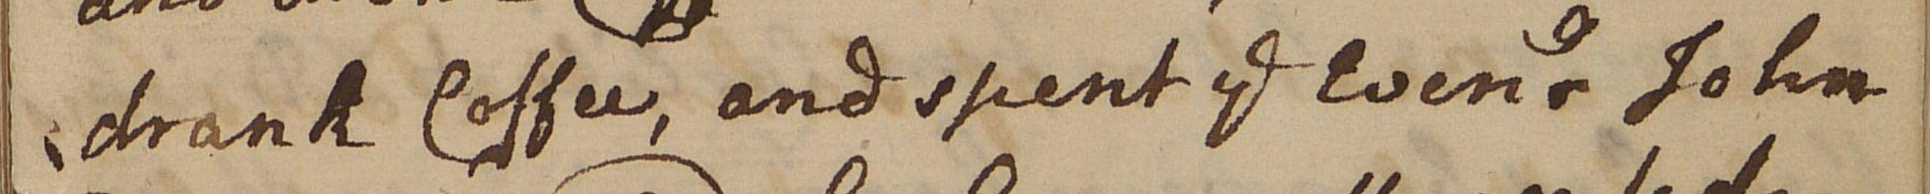drank Coffee, and spent y^e Even^g. John
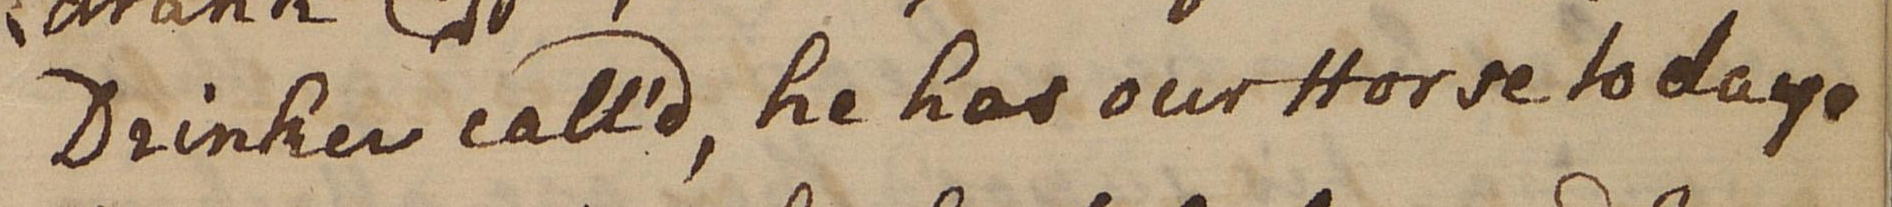Drinker call'd, he has our Horse to day-
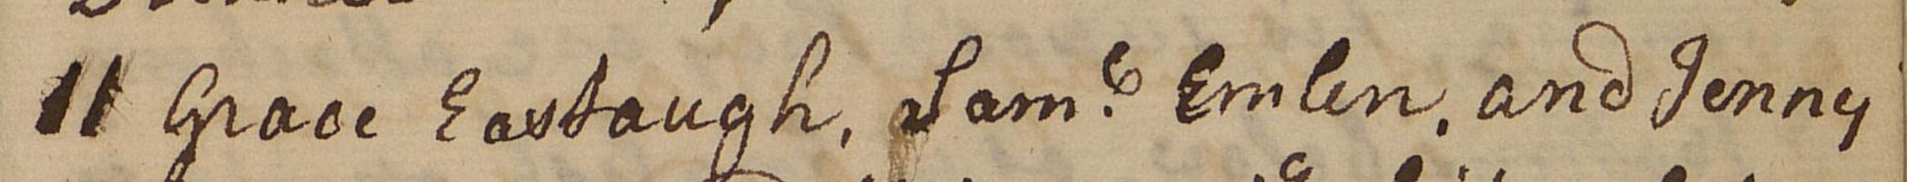11 Grace Eastaugh, Sam^l. Emlen, and Jenny
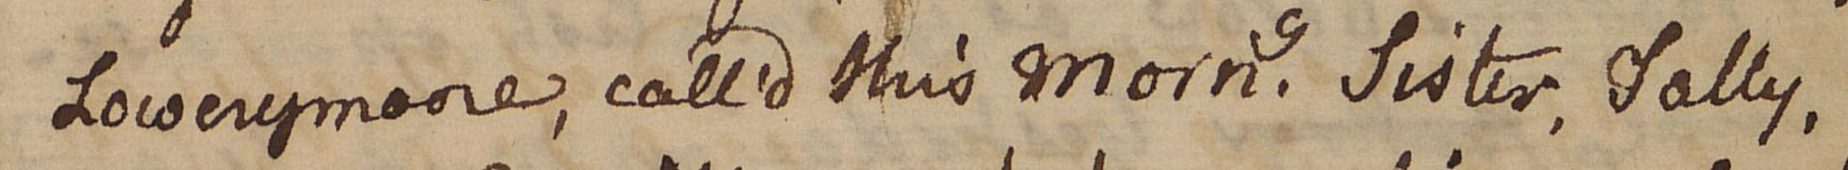Lowerymoore, call'd this Morn^g. Sister, Sally,
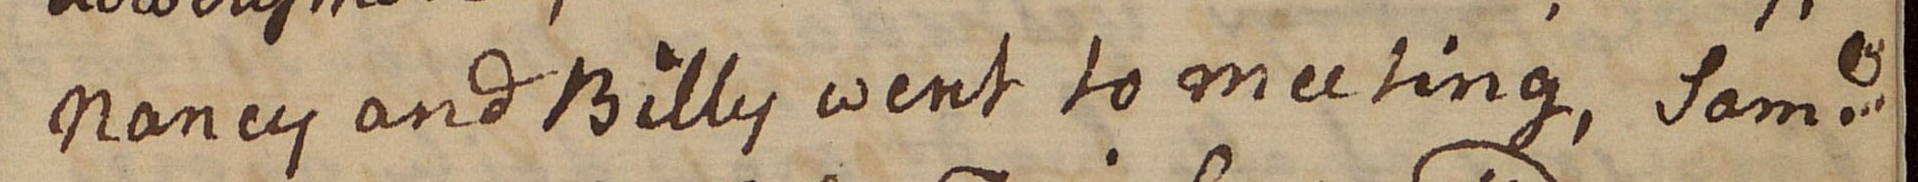Nancy and Billy went to meeting, Sam^l.
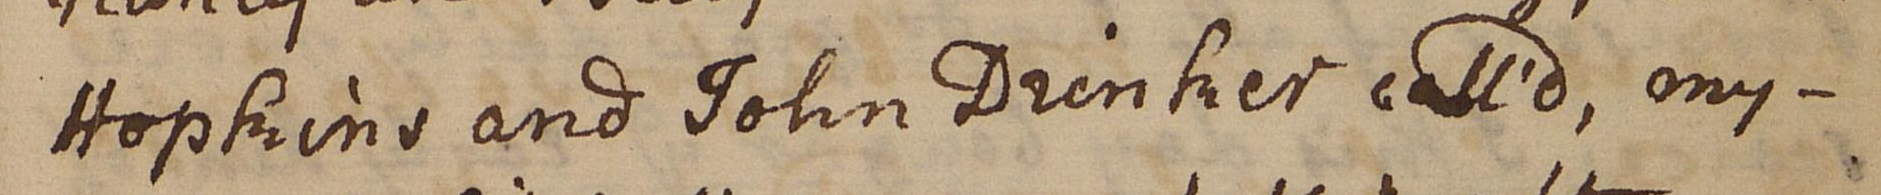Hopkins and John Drinker call'd, my-
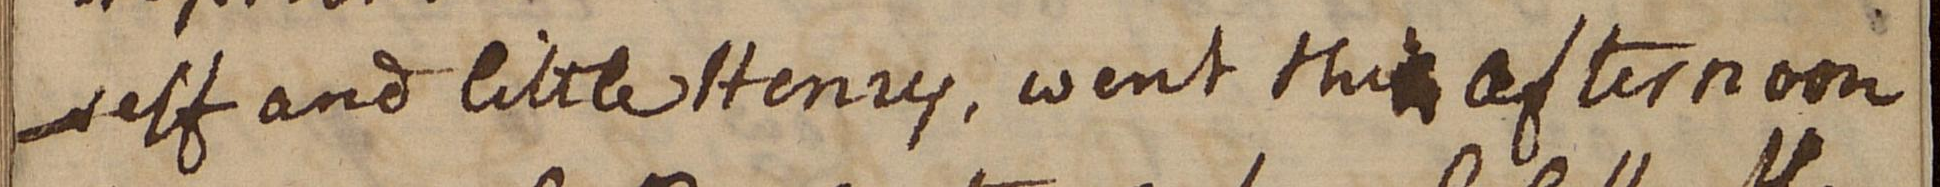left and little Henry, went this Afternoon
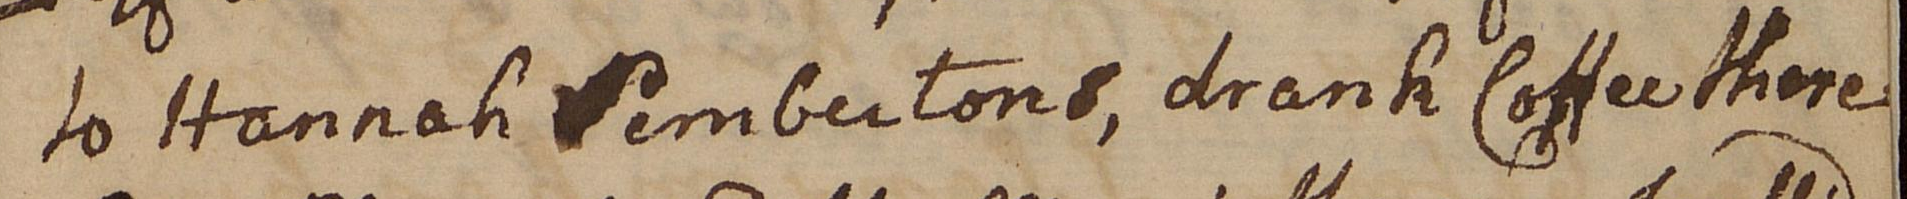to Hannah Pembertons, drank Coffee there
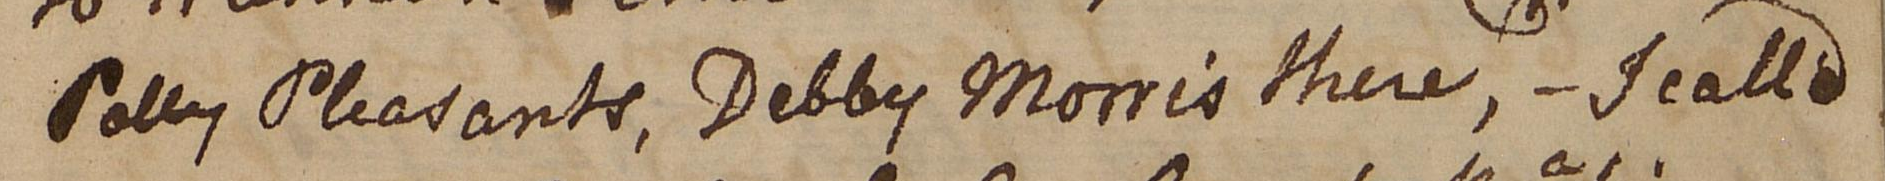Polly Pleasants, Debby Morris there,- I call'd
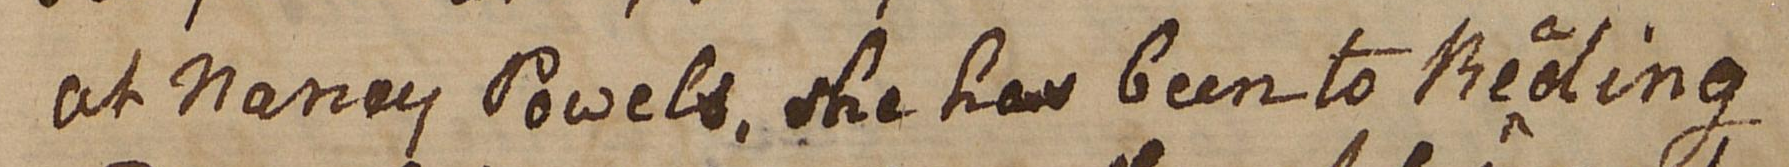at Nancy Powels, she has been to Re^a ding
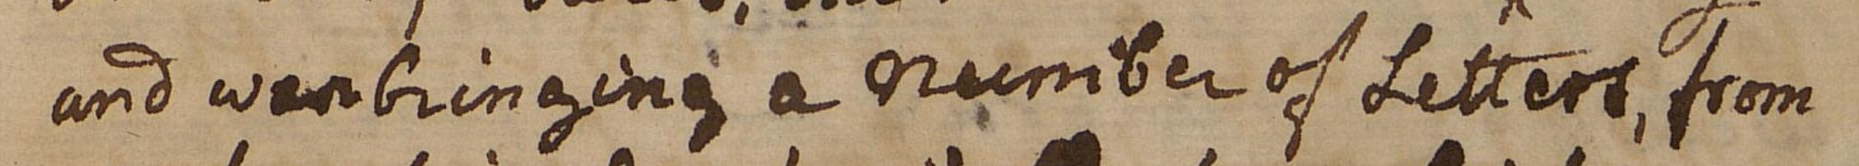and was bringing a Number of Letters, from
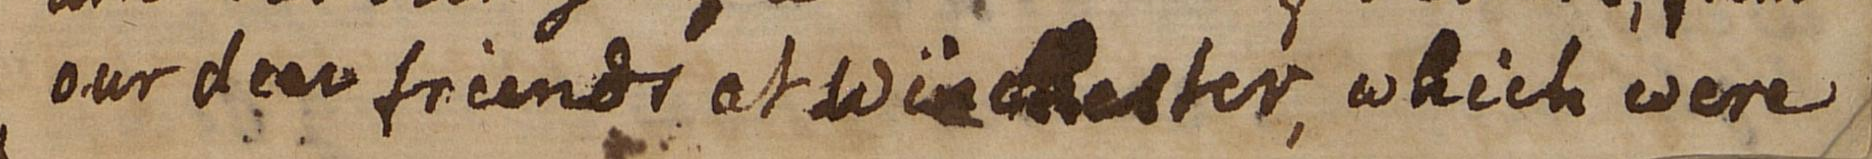our dear friends at Winchester, which were
